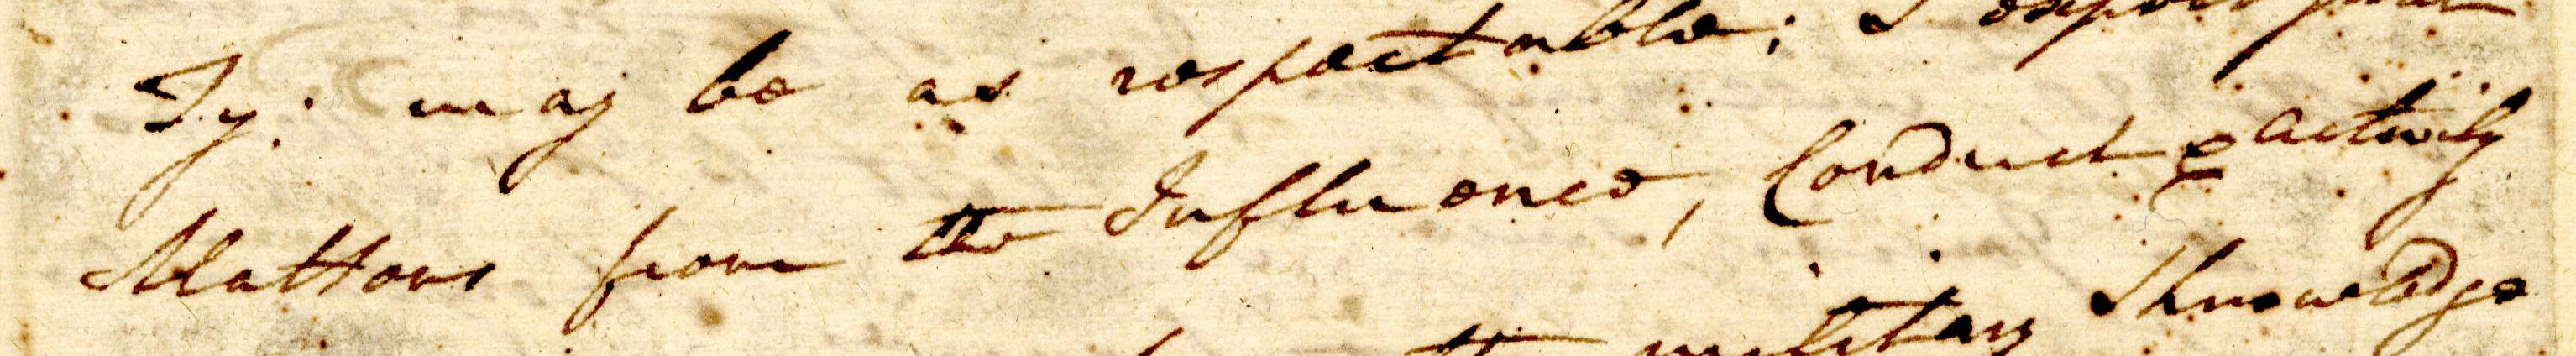Matters from the Influence, Conduct & activity
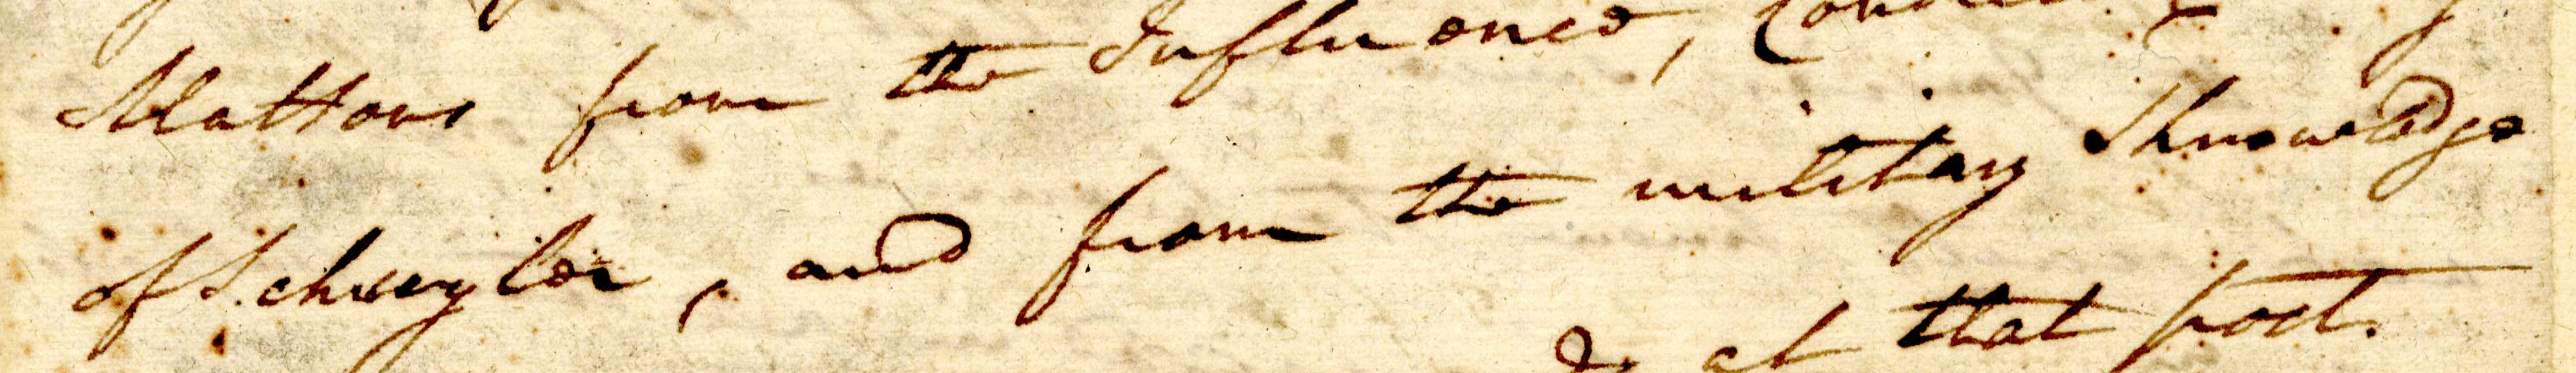of Schuyler, and from the military I Should go
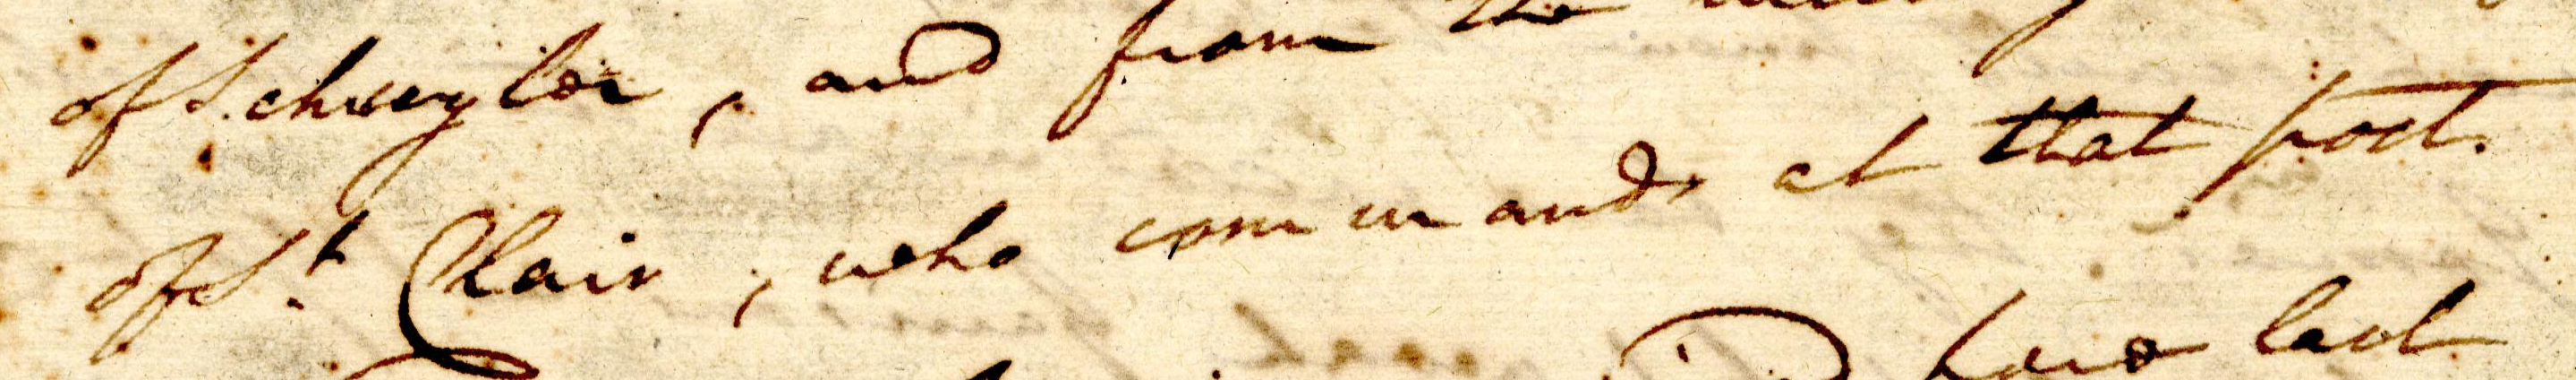of S^t. Clair, who commands at that post
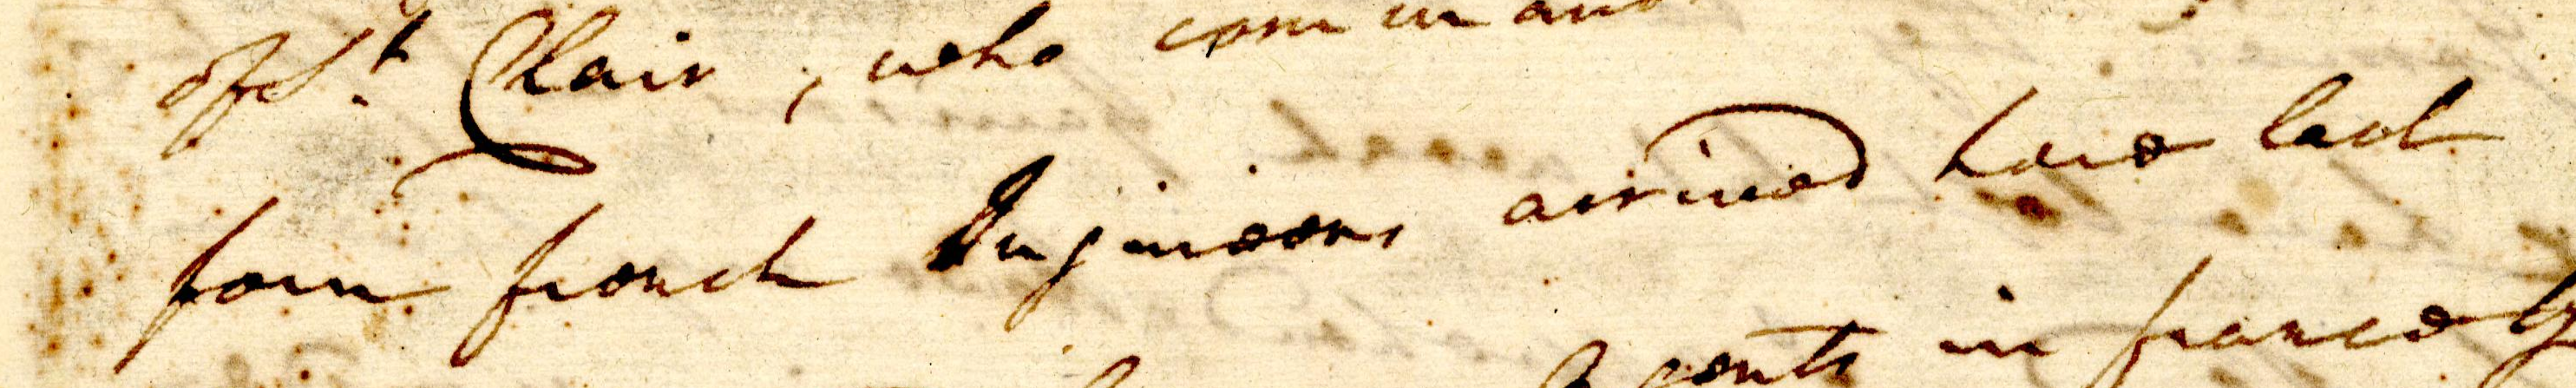four french Engineers arrived here last
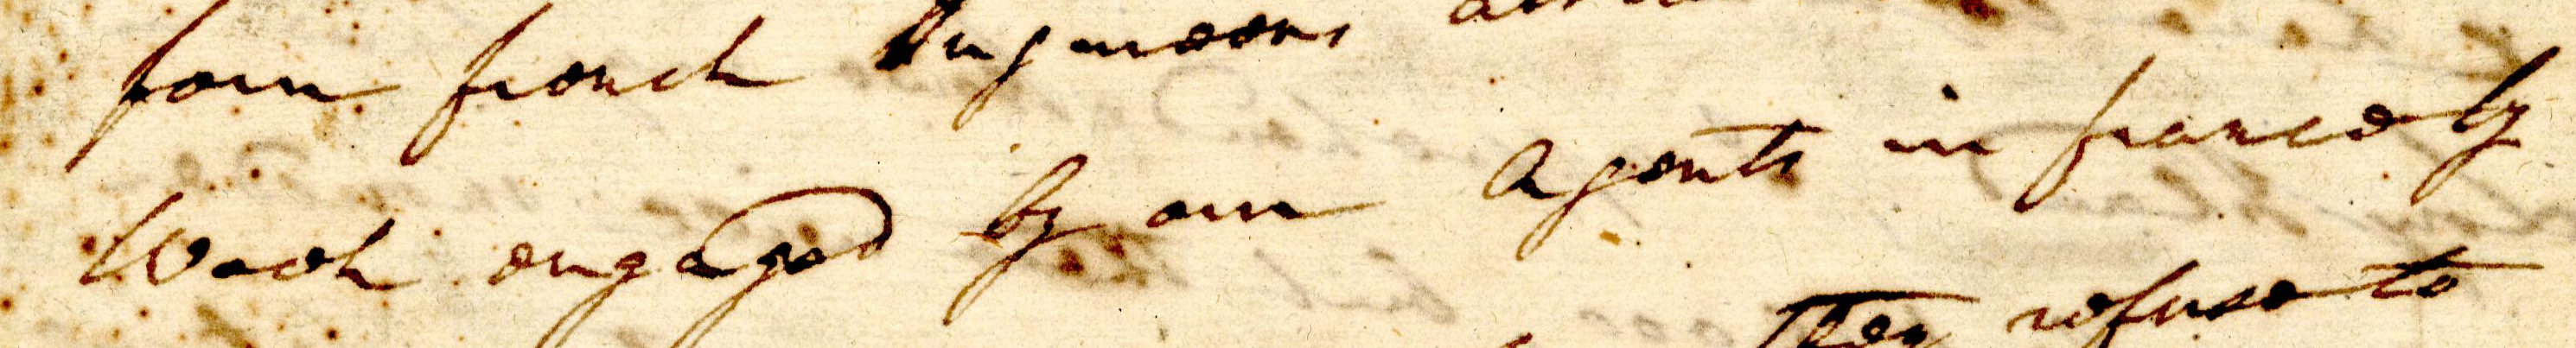Week engaged by our agents in France by
